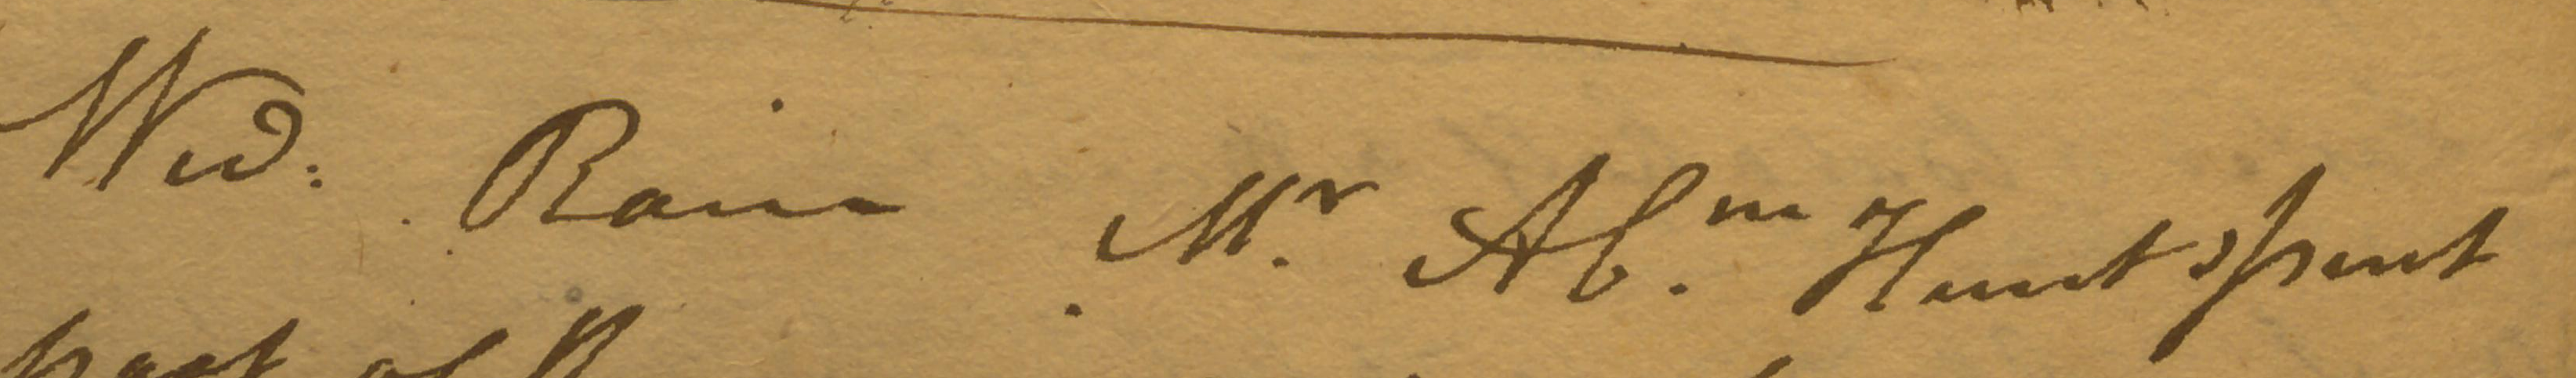Wed. Rain M^r. Ab^m. Hunt spent
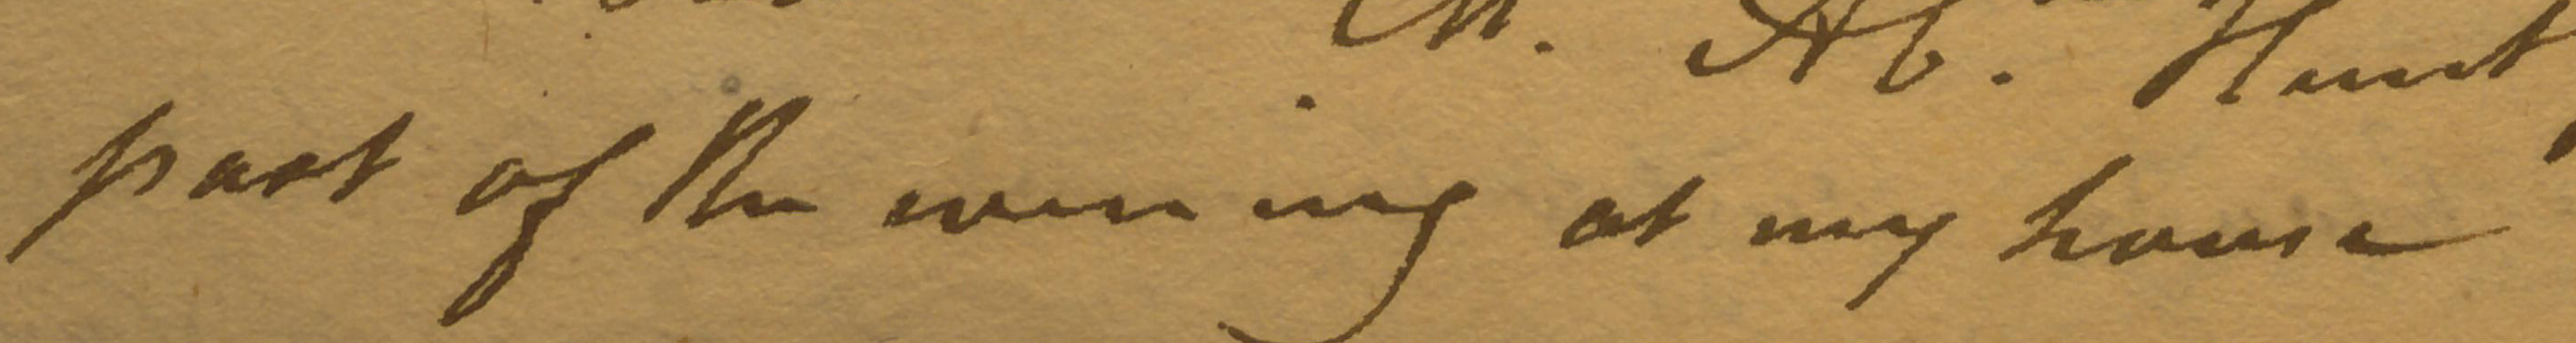part of the evening at my house
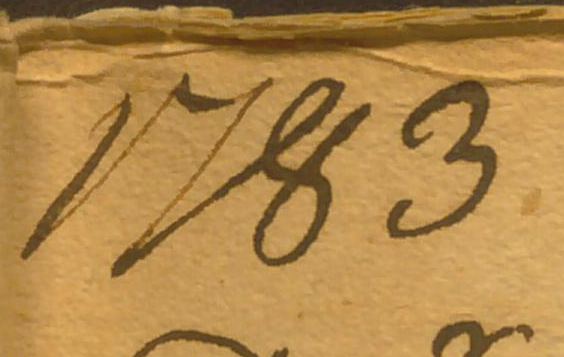1783
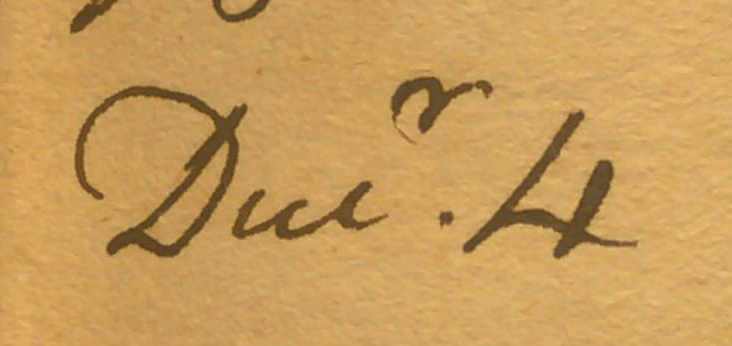Dece^r. 4
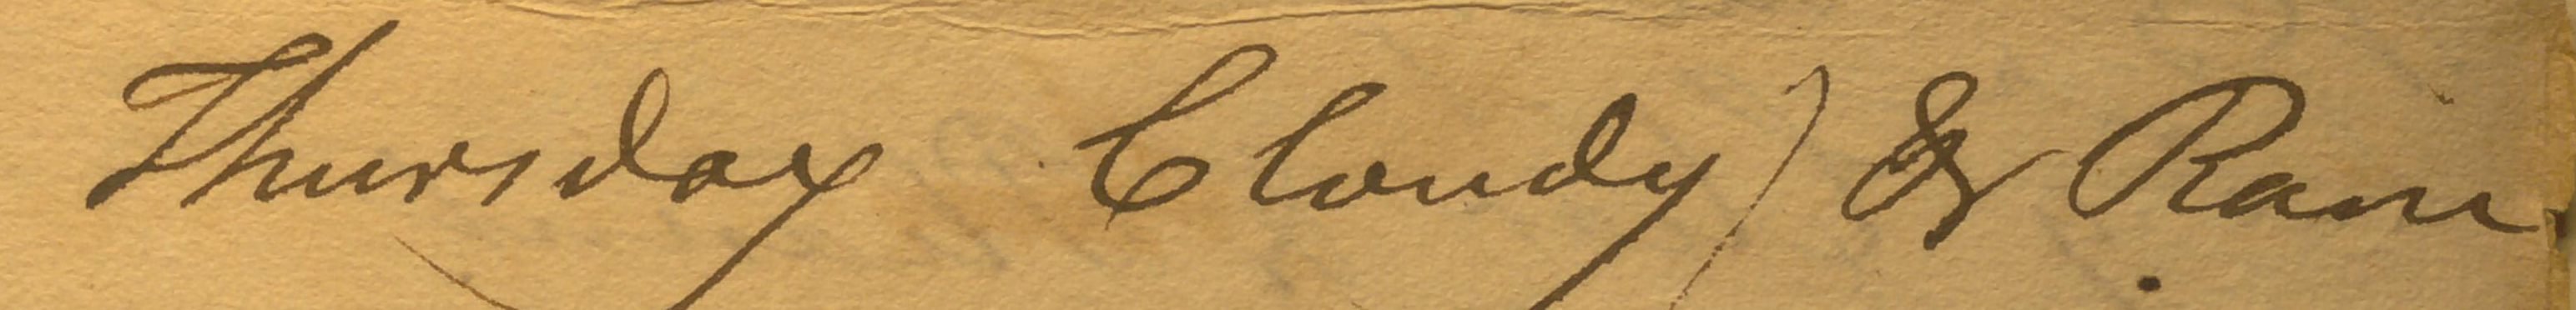Thursday Cloudy & Raw
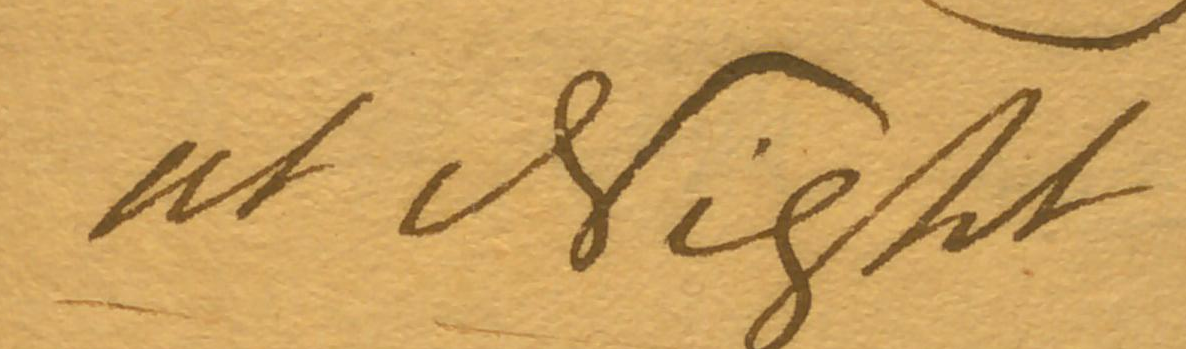at Night
